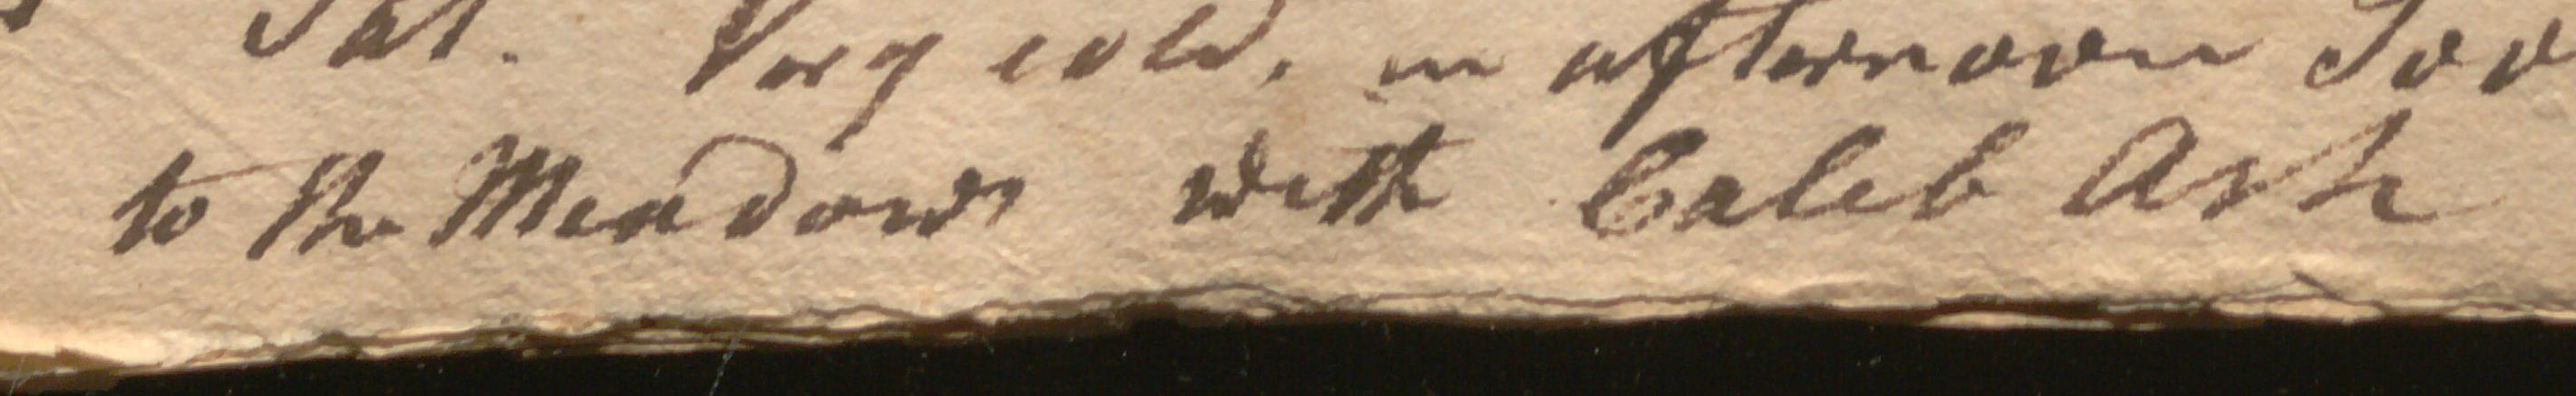to the Meadows with Caleb Ash
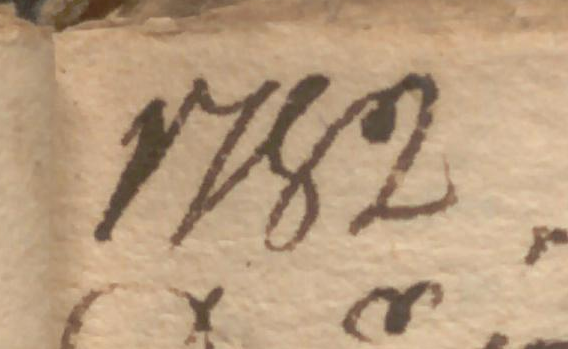1782
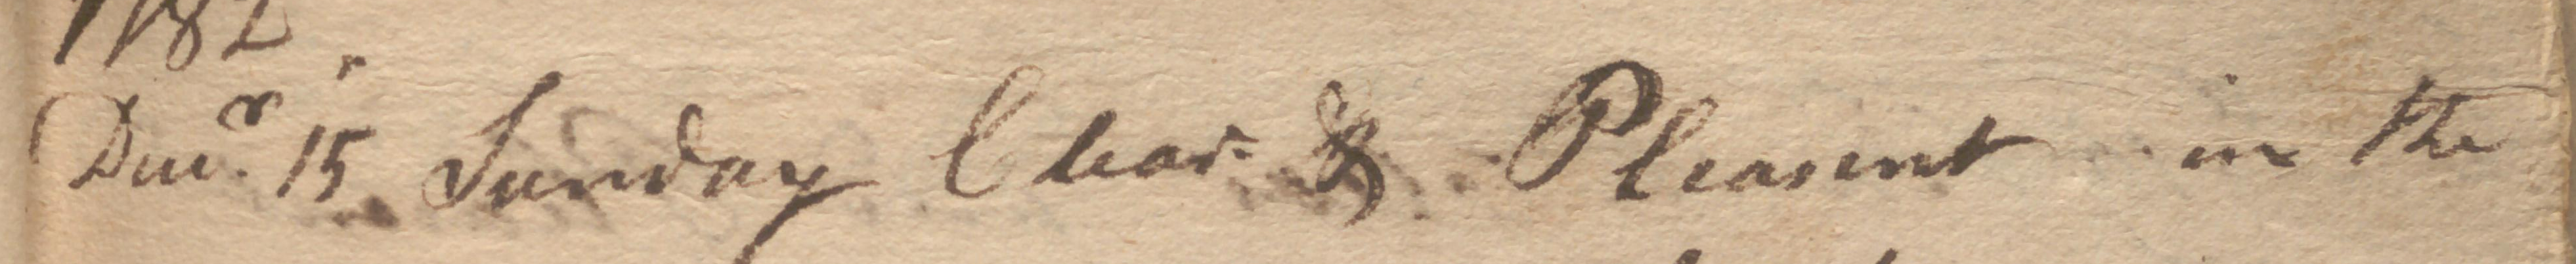Dec^r. 15 Sunday Clear & Pleasent in the
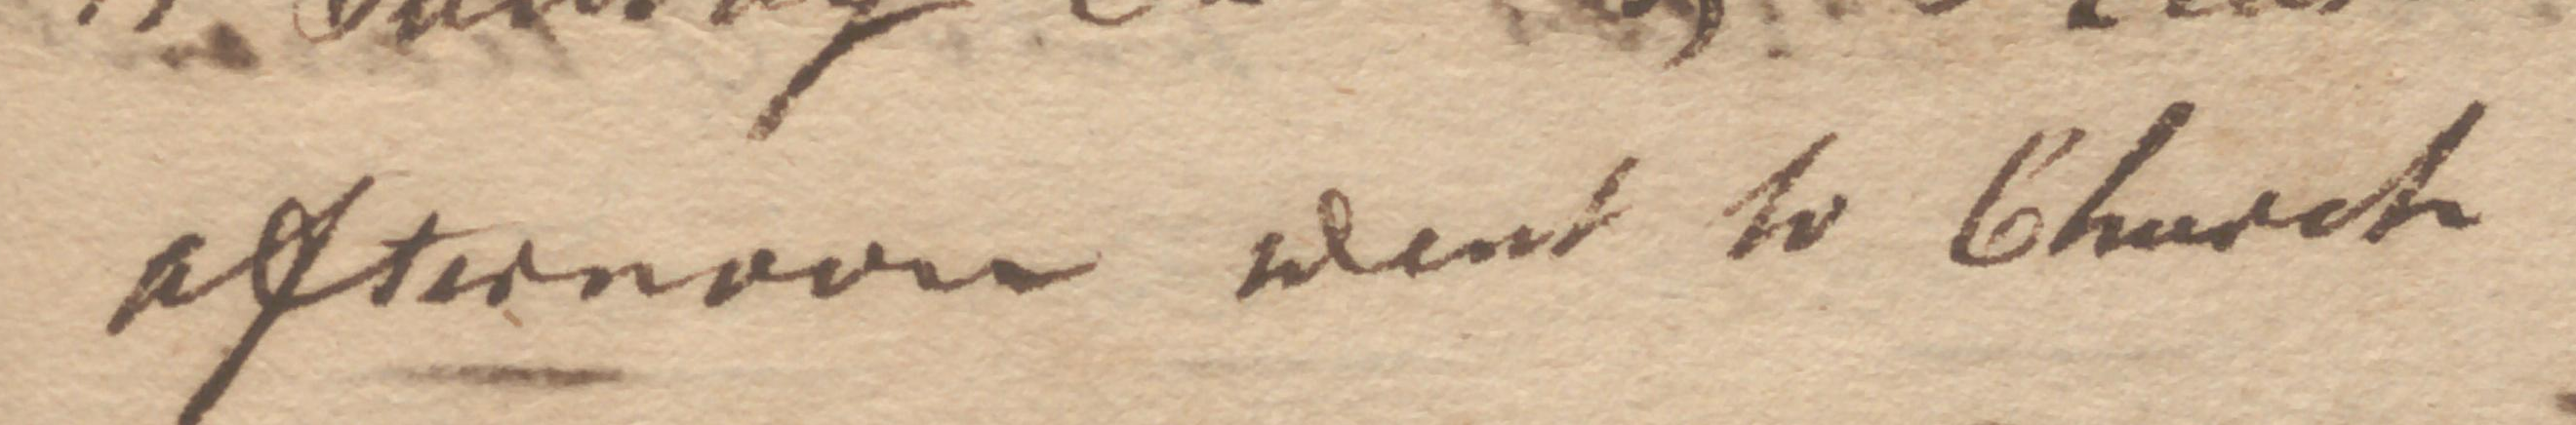afternoon went to Church
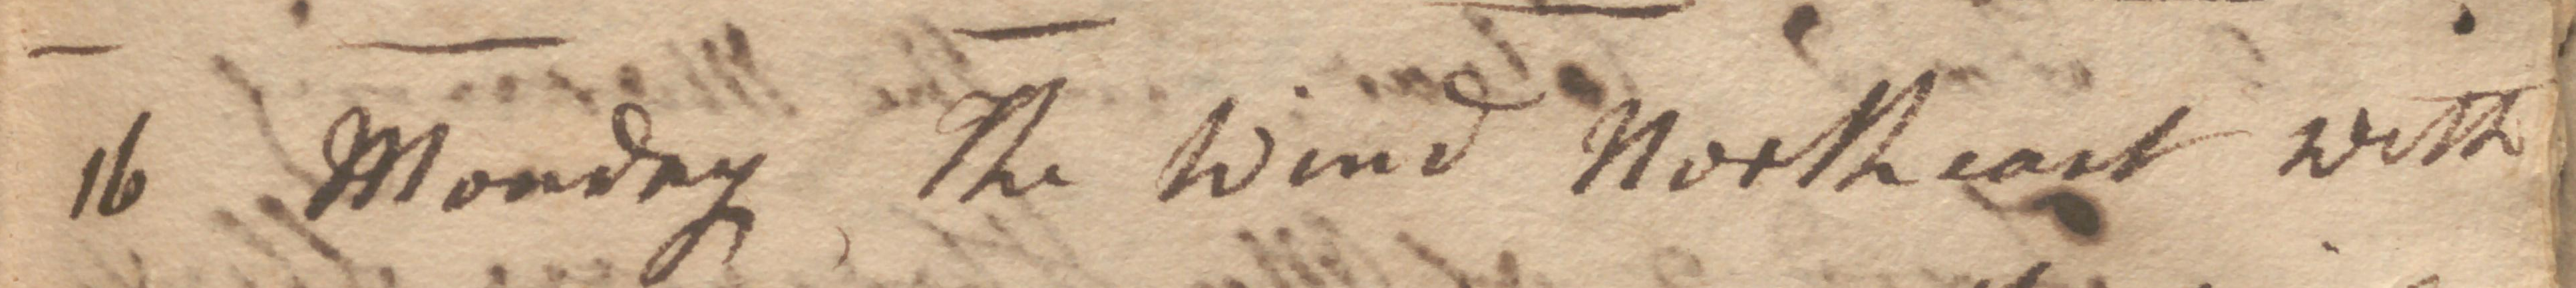16 Monday the wind Northeast with
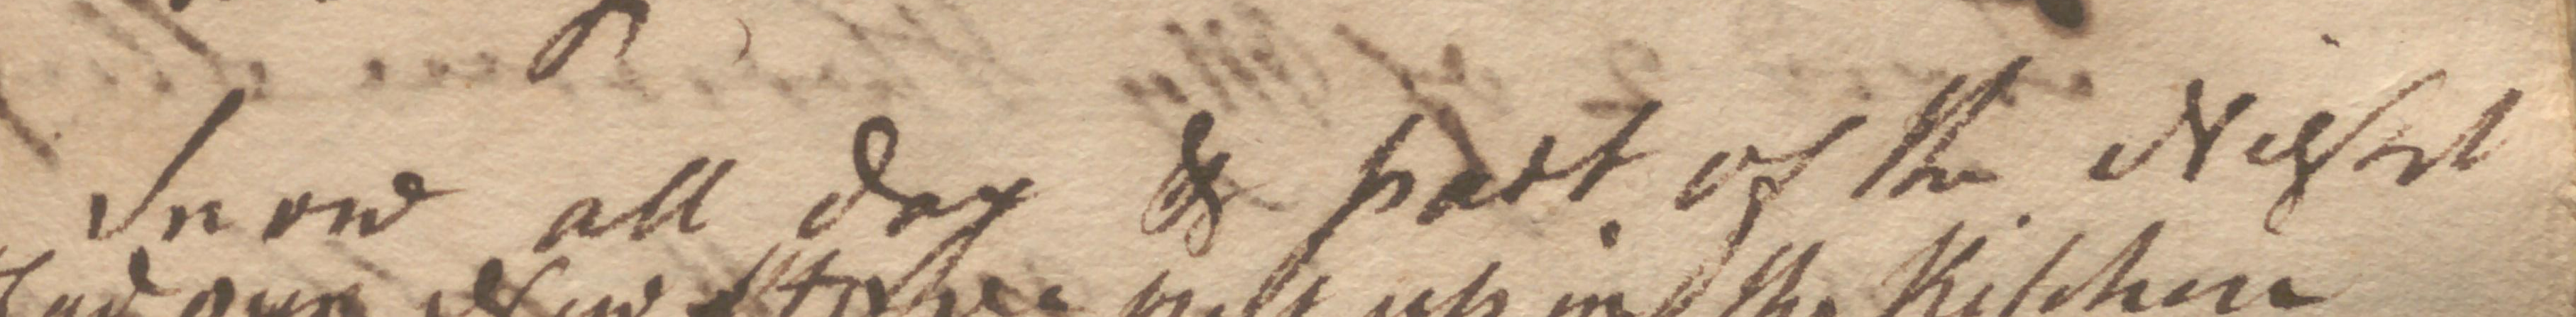snow all day & part of the Night
